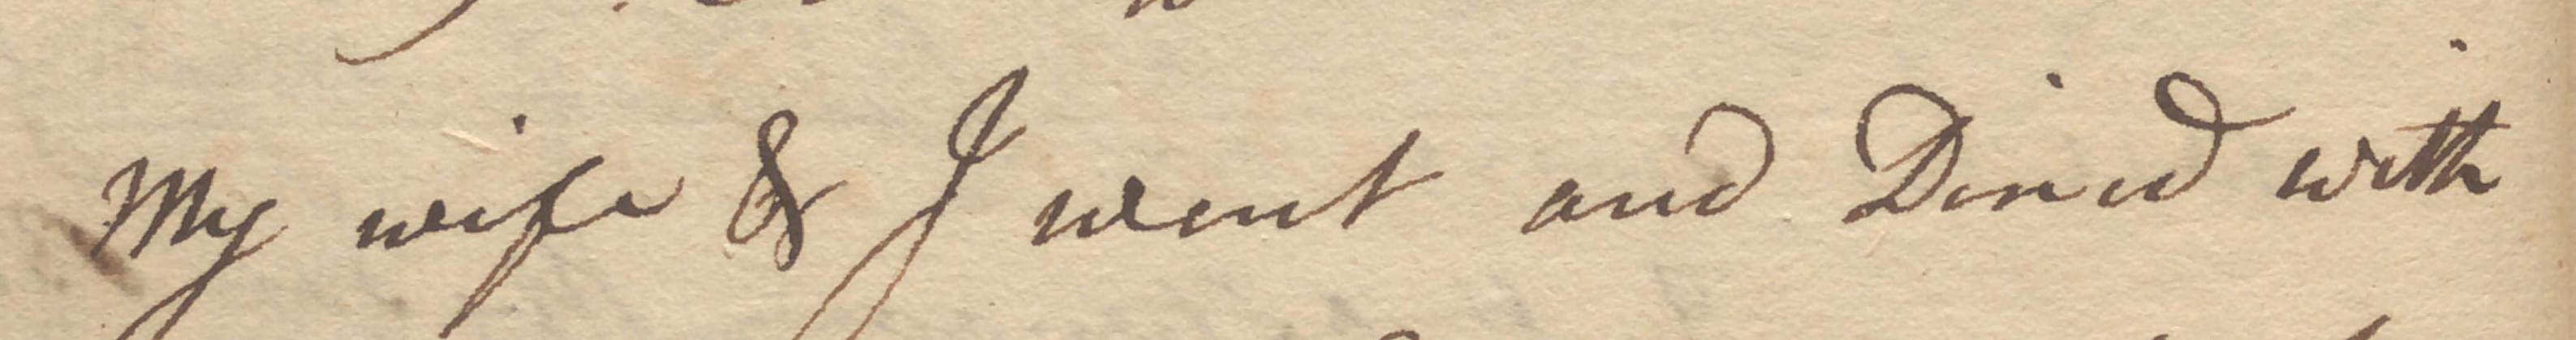My wife & I went and Dined with
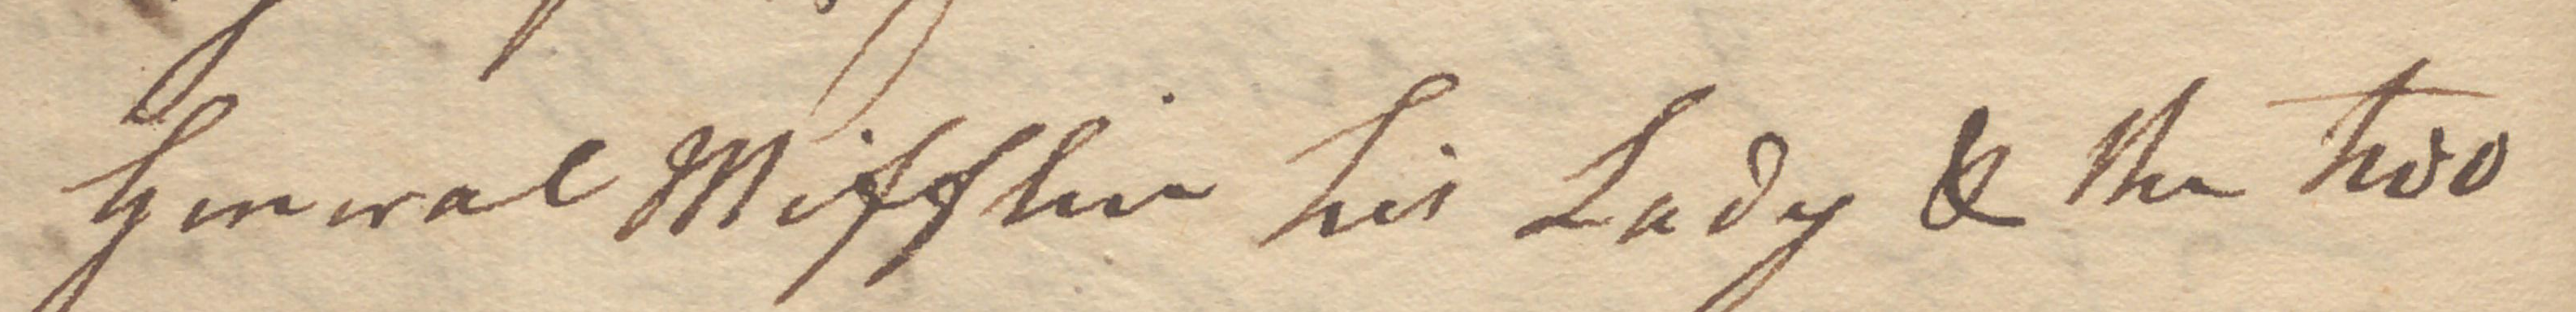General Mifflin his Lady & the two
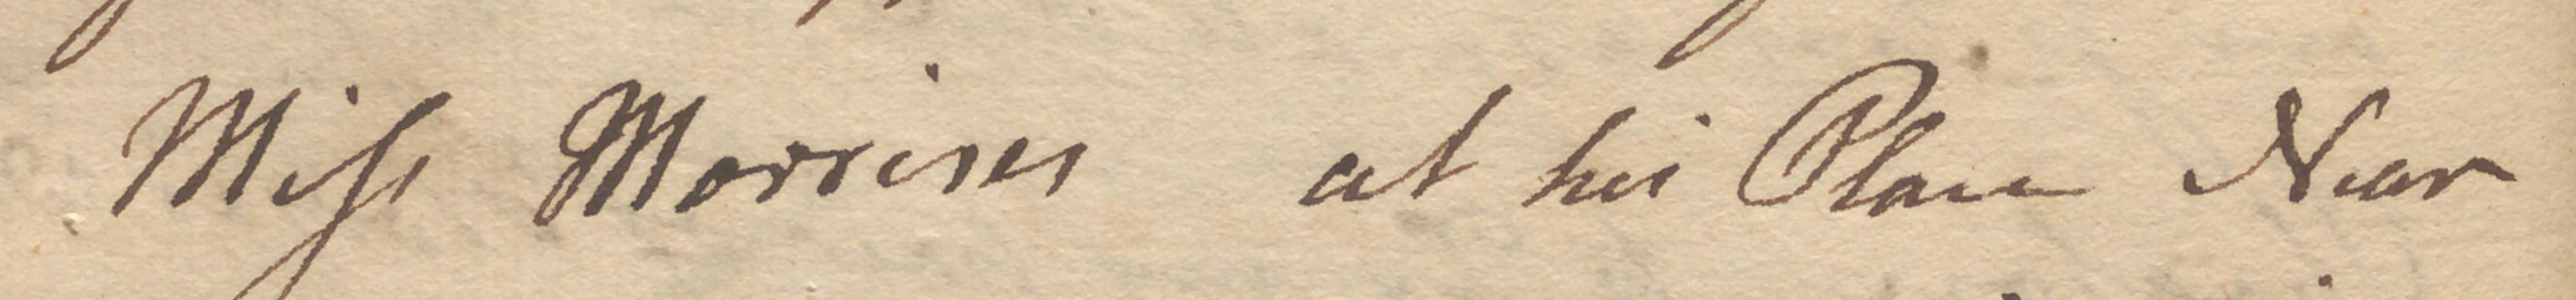Miss Morrises at his Place Near
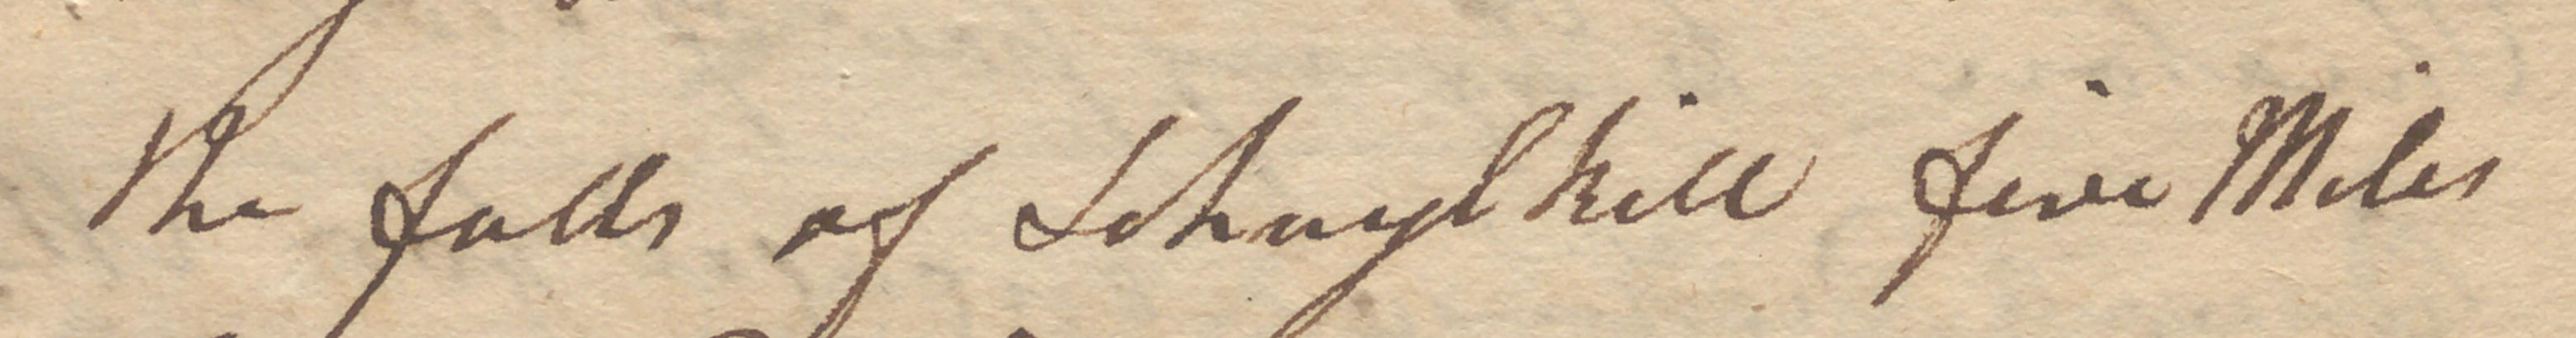the falls of Schuylkill five Miles
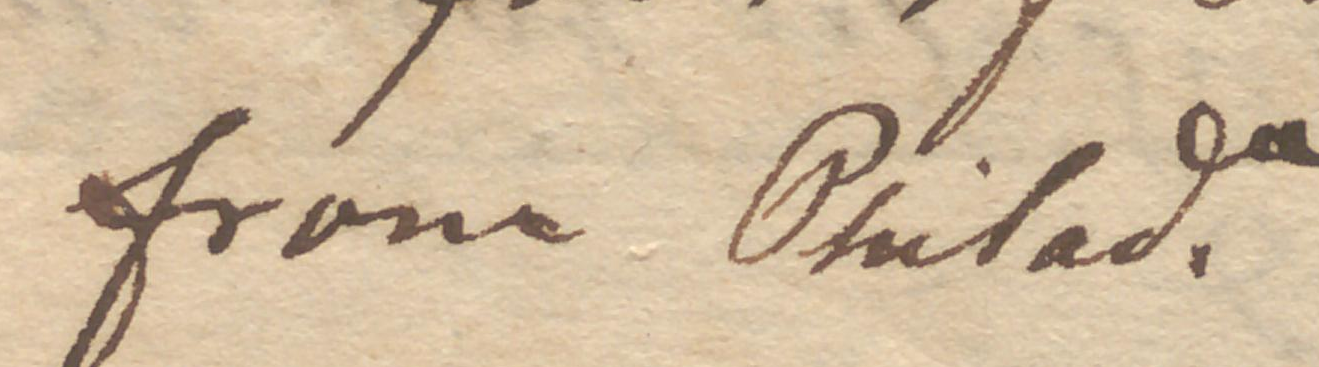from Philad^a.
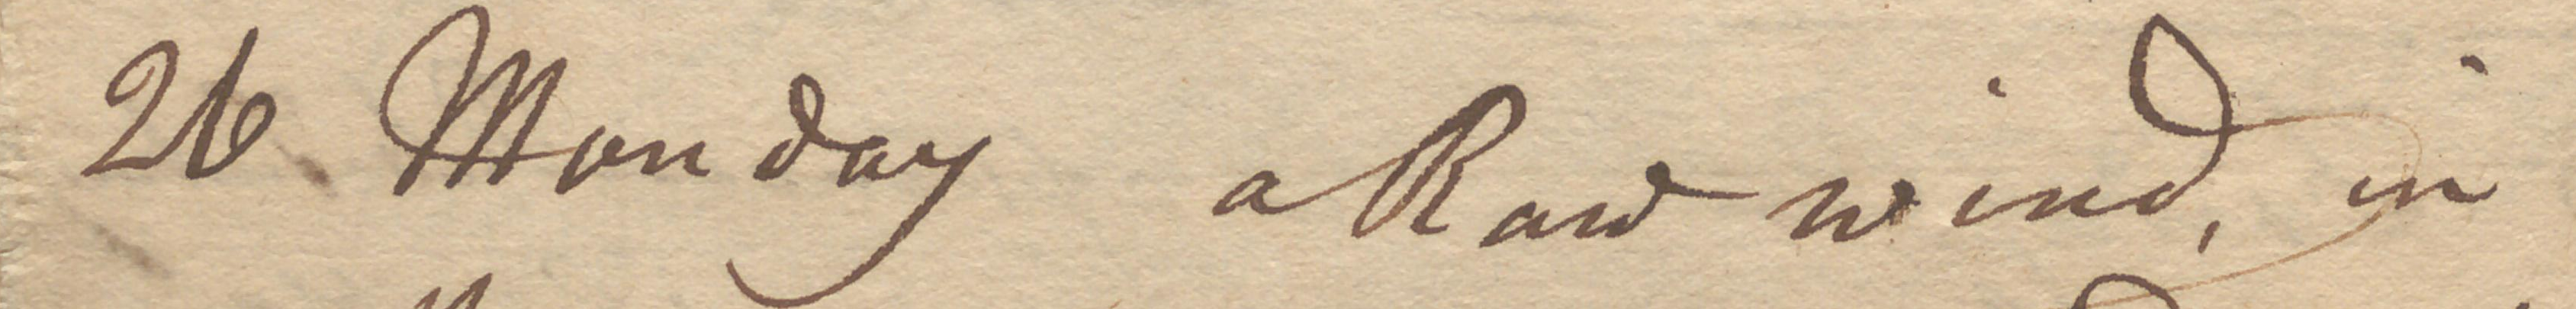26 Monday a Raw wind, in
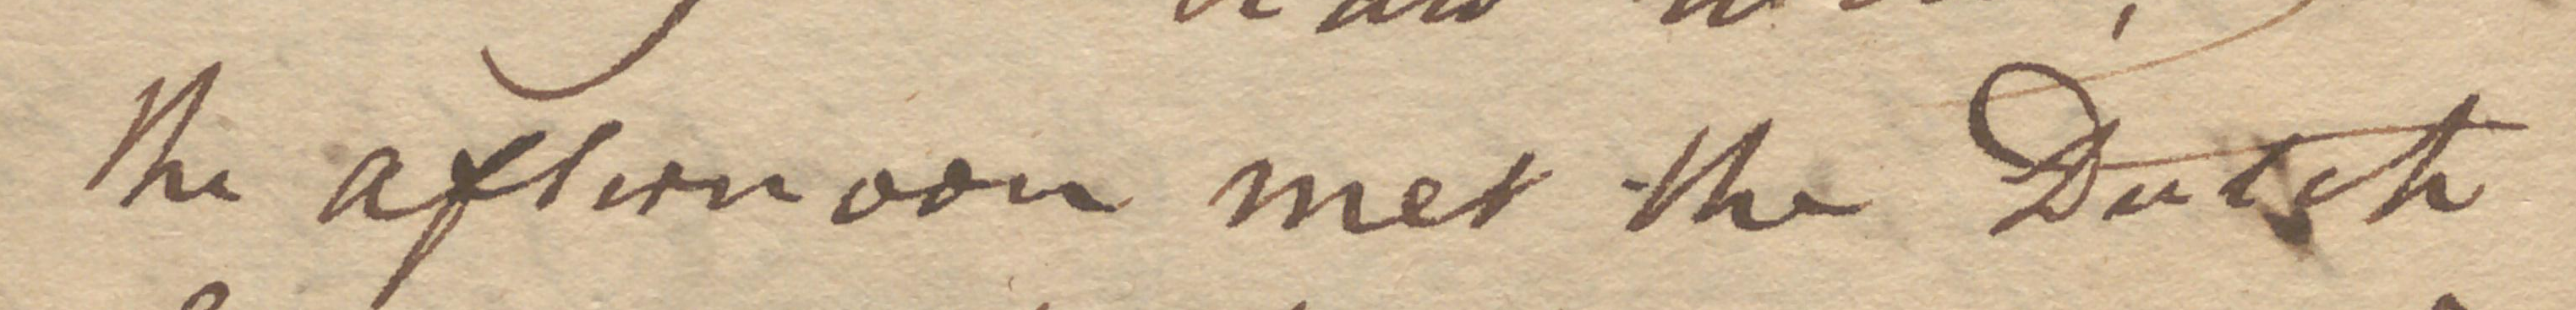the afternoon met the Dutch
